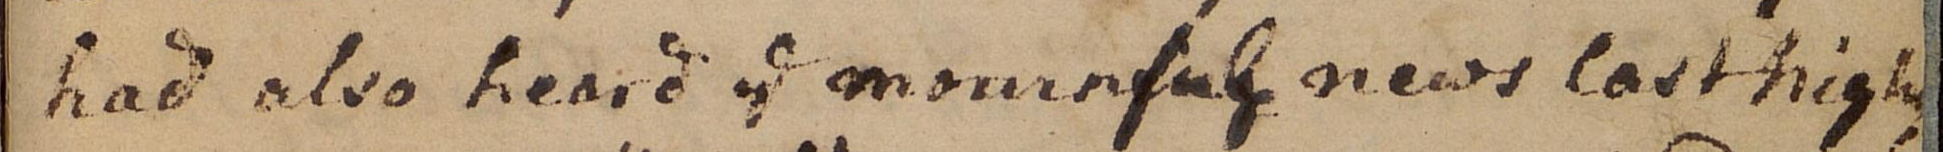had also heard y^e mournful news last Night
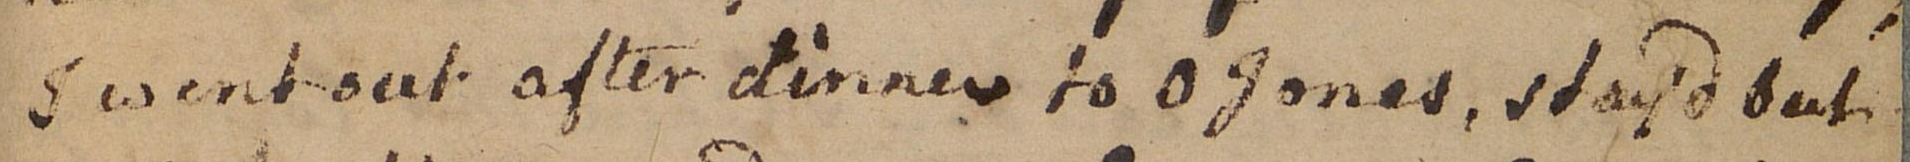I went out after dinner to O Jones, stay'd but
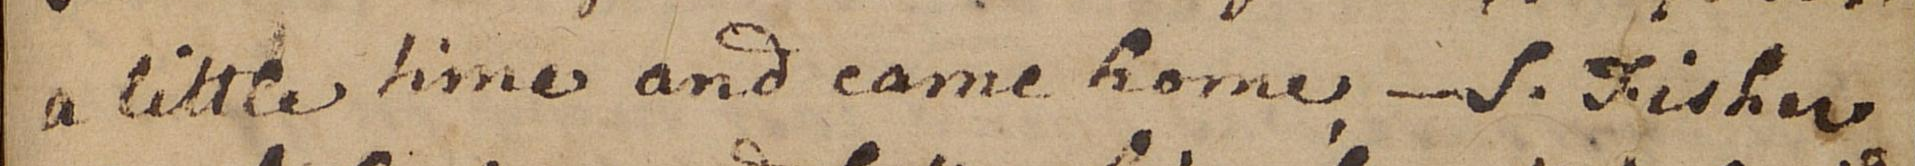a little time and came home- S. Fisher
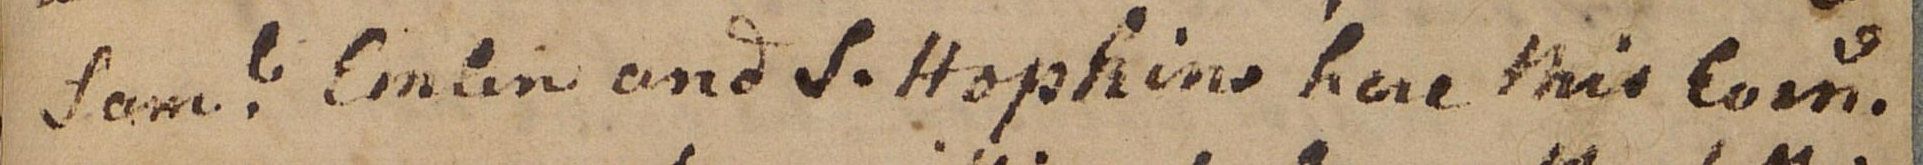Sam^l. Emlen and S. Hopkins here this Even^g.
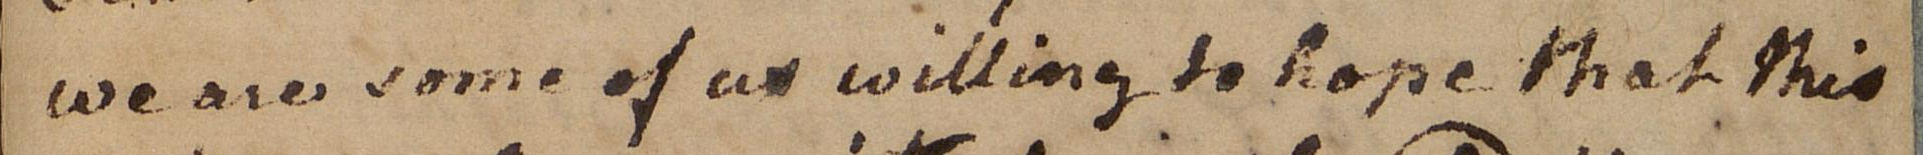we are some of us willing to hope that this
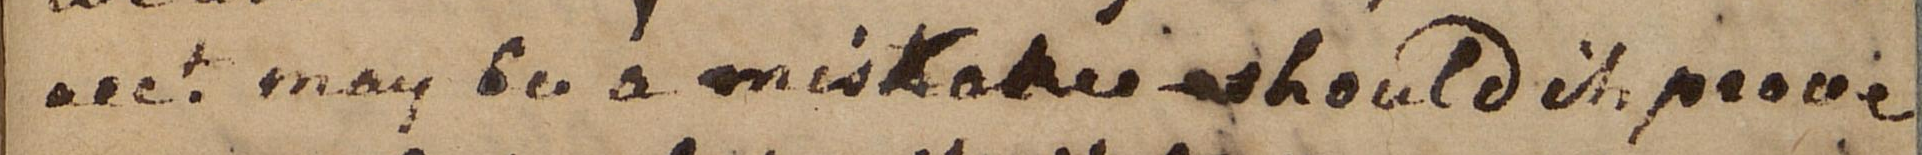acc^t. may be a mistake- should it prove
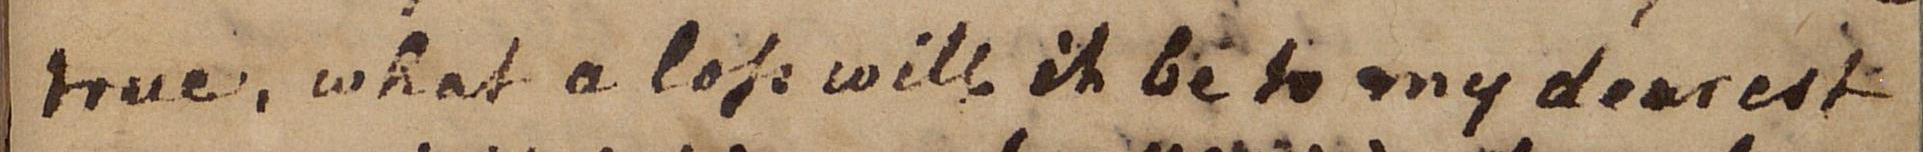true, what a loss will it be to my dearest
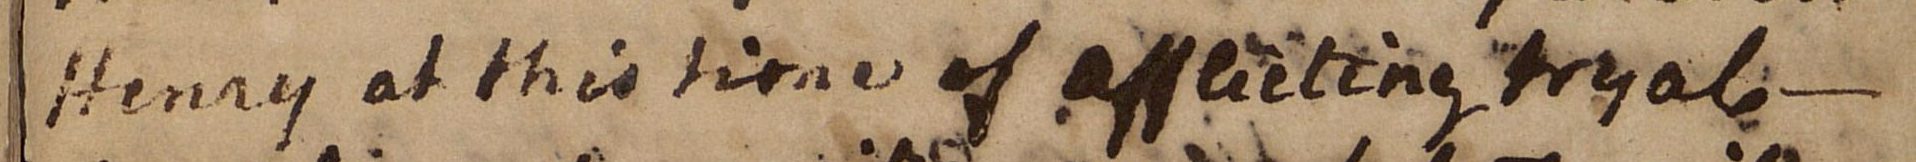Henry at this time of Afflicting tryal-
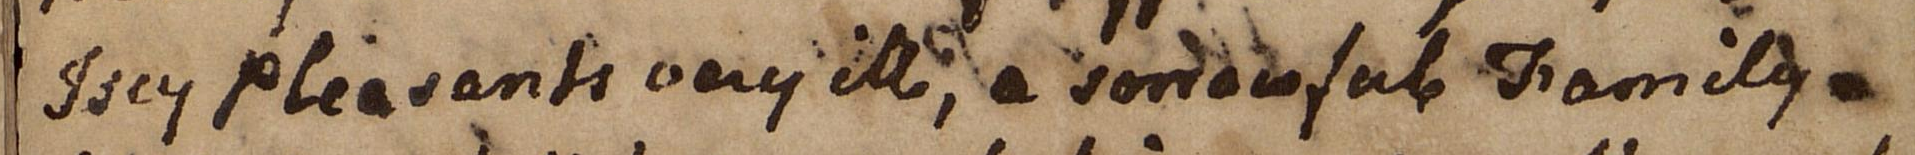Jsey Pleasants very ill, a sorrowful Family-
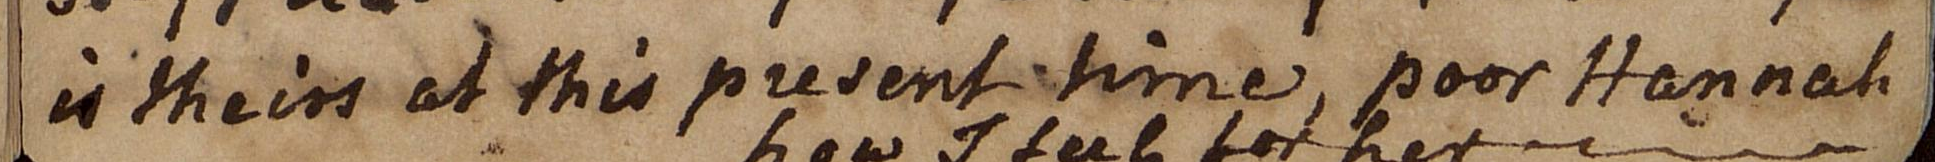is theirs at this present time, poor Hannah
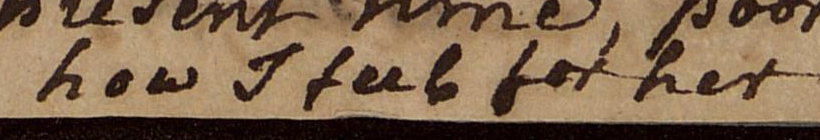how I feel for her -
